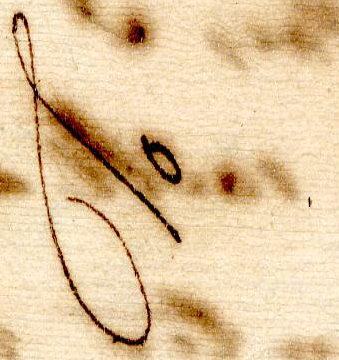To
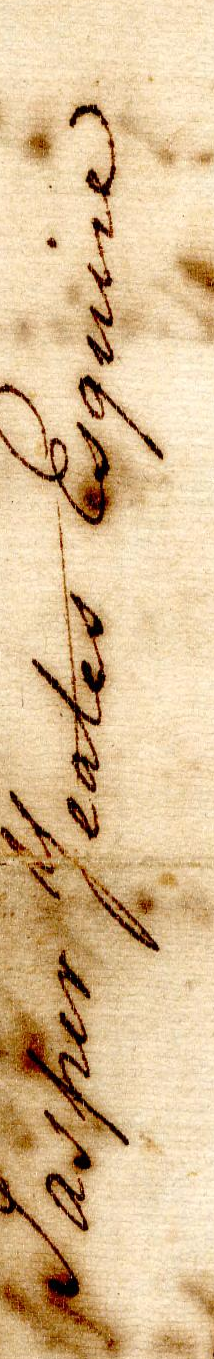Jasper Yeates Esquire
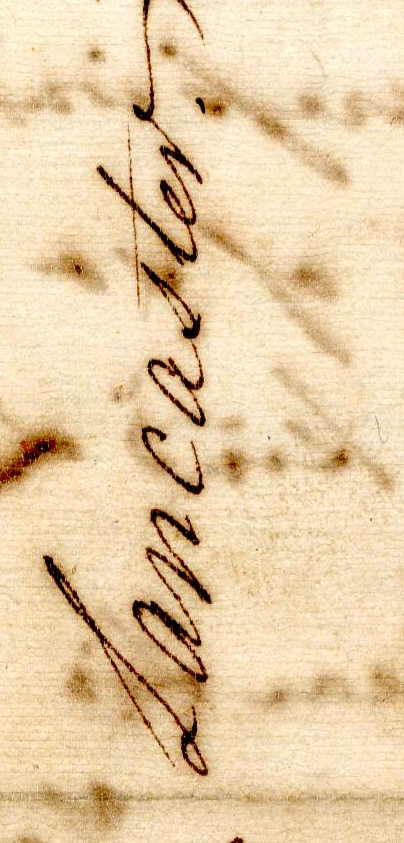Lancaster
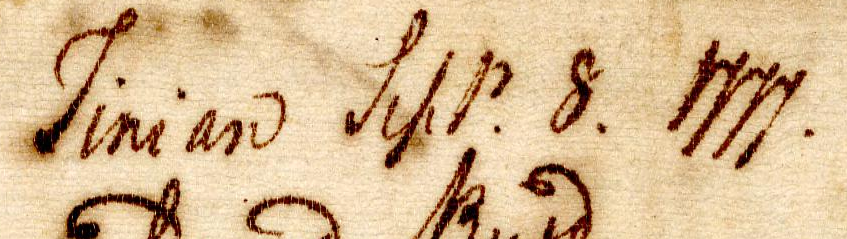Tinian Sept^r. 8. 1777.
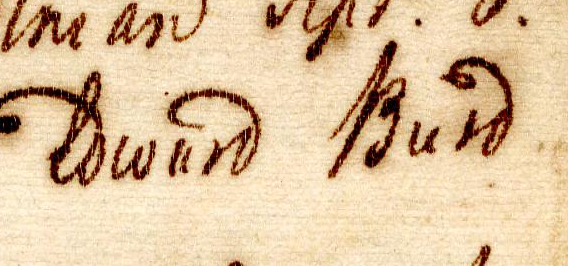Edward Burd
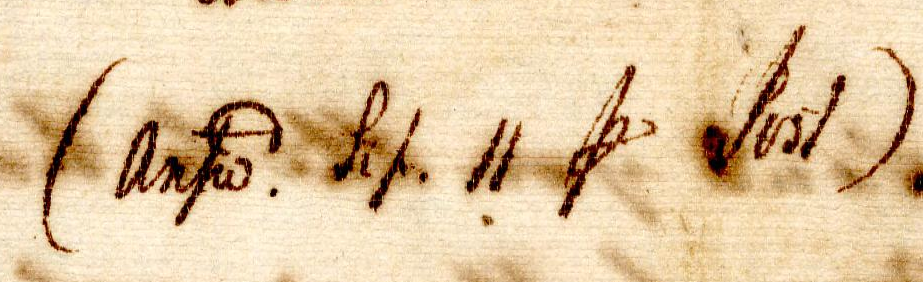(Answ^d. Sep. 11 per Post)
